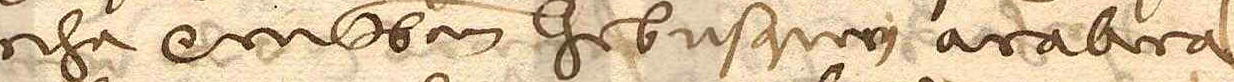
nha e eu t̄bam lhe busquey a cabeça
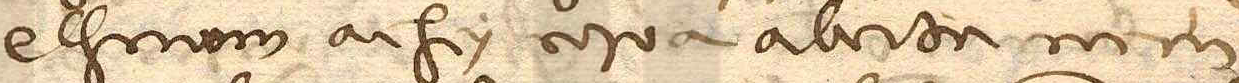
e lhe nom achey coroa aberta nem
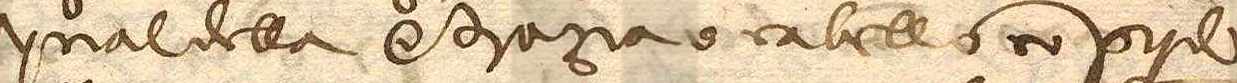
synal della e trazia o cabello c̄oprjdo
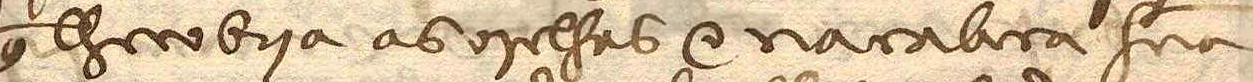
q̄ lhe cobrja as orelhas e na cabeca hūa
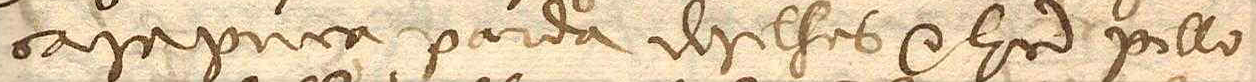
carapuça parda dorelhas e hū pello
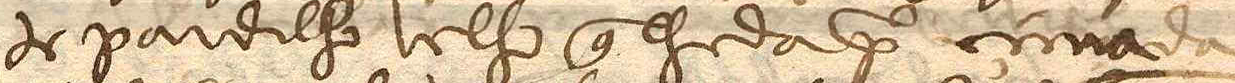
te pardilho velho q̄ lhe da p̄o çima da
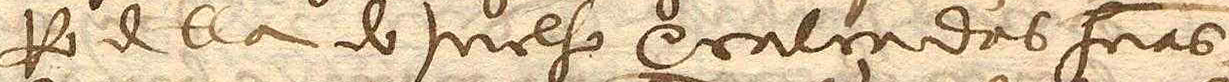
Rodella do Juelho e calçadas hūas
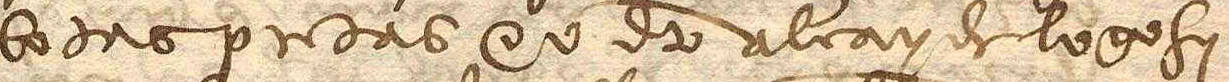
botas pretas e o d̄to alcayde logo hy
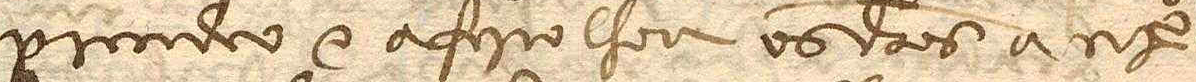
prendeo e aferrolhou os d̄tos anto
